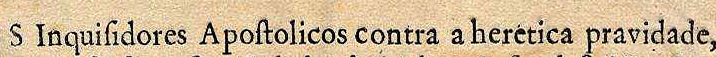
S Inquisidores Apostolicos contra a heretica pravidade,
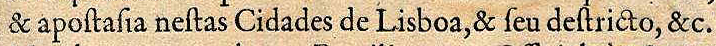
& apostasia nestas Cidades de Lisboa, & seu destricto, &c.
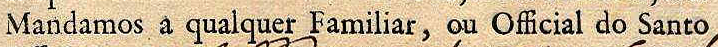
Mandamos a qualquer Familiar, ou Official do Santo
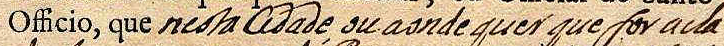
Officio, que nesta Cidade, ou aonde quer que for acha
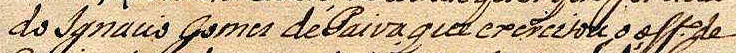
do Ignacio Gomes de Paiva, que exercitou o off.o de
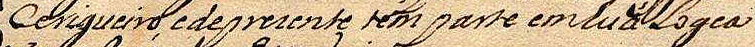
Cerigueiro, e de prezente tem parte em huā Logea
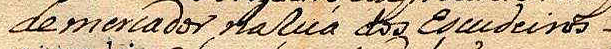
de mercador na Rua dos Escudeiros
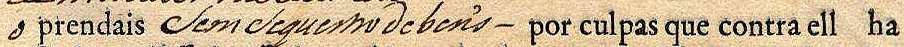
o prendais sem sequestro de ben̄s por culpas que contra ell ha
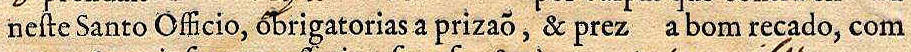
neste Santo Officio, obrigatorias a prizaõ, & prez a bom recado, com
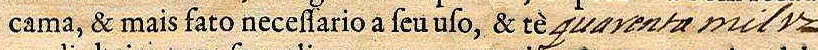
cama, & mais fato necessario a seu uso, & tè quarenta mil rz
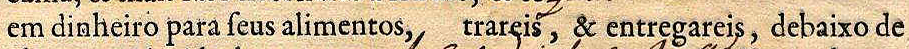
em dinheiro para seus alimentos, trareis, & entregareis, debaixo de
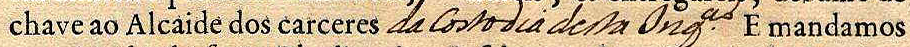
chave ao Alcaide dos carceres da Costodia desta Inq.aõ E mandamos
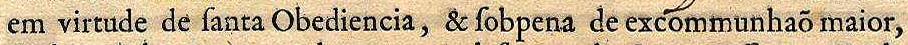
em virtude de santa Obediencia, & sobpena de excommunhaõ maior,
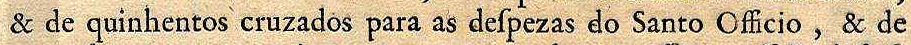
& de quinhentos cruzados para as despezas do Santo Officio, & de
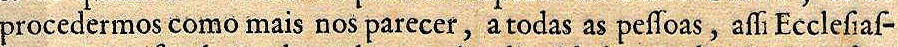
procedermos como mais nos parecer, a todas as pessoas, assi Ecclesias
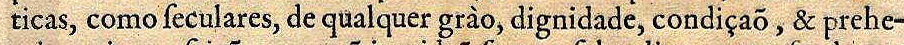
ticas, como seculares, de qualquer grào, dignidade, condiçaõ, & prehe
